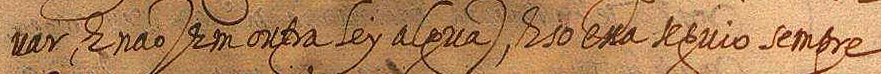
uar, E não Em outra ley alguā, E so essa seguio sempre
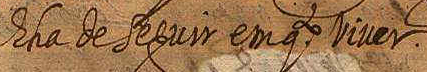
E ha de seguir emqto. viuer.
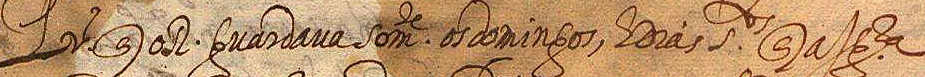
Porq̄ o R. guardaua somte. os domingos, E dias stos. q̄ a Jg.ra
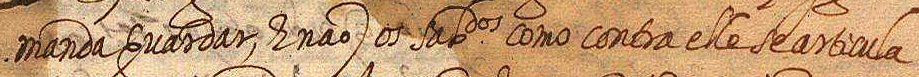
manda guardar, E não os sabdos. como contra elle se articula
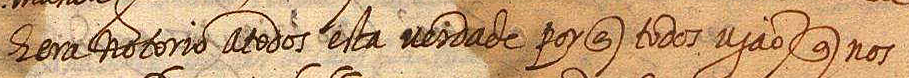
E era notorio a todos esta uerdade porq̄ todos ujão q̄ nos
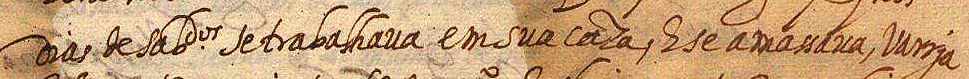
dias de sabdos. se trabalhaua em sua caza, E se amassaua, varrja
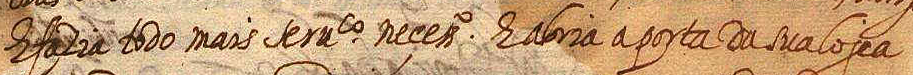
E fazia todo o mais seruço. necesso. E abria a porta da sua lojea
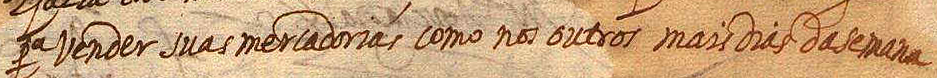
ꝑa vender suas mercadorias como nos outros mais dias da semana
